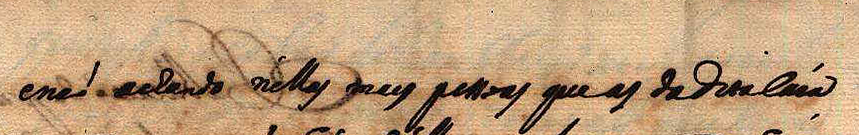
e naõ achando nellas maes pessoas que as da dita Caza
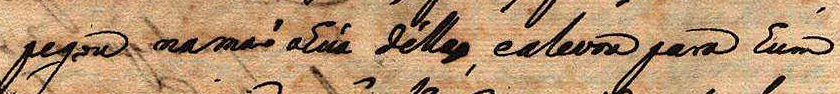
pegou na maõ a hūa dellas, e a levou para hum
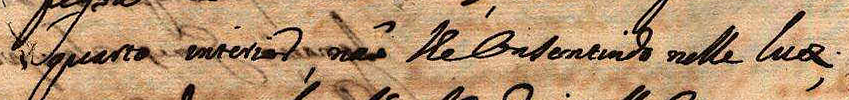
quarto interior naõ lhe Consentindo nelle lux;
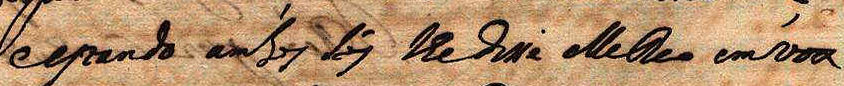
e estando ambos sós lhe disse elle Reo em vox
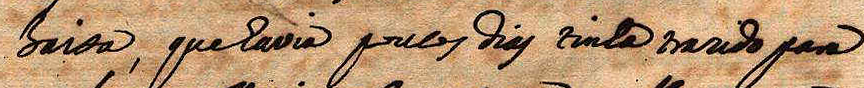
baixa, que havia poucos dias tinha trazido para
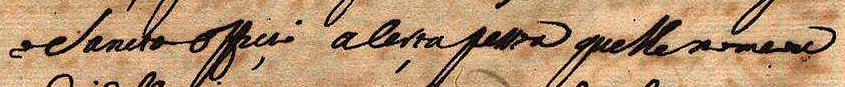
o Sancto officio a certa pessoa que lhe nomeou
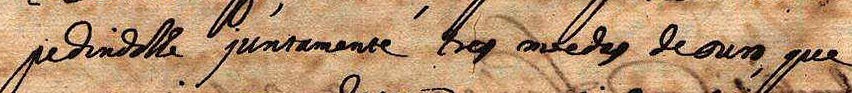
pedindolhe juntamente tres moedas de ouro, que
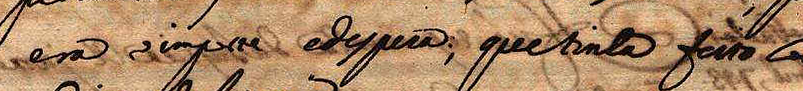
era o importe e despeza; que tinha feito Com
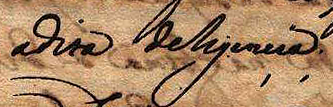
a dita deligencia.
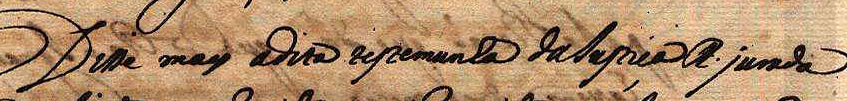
Disse mais a dita testemunha da Iustiça A. jurada
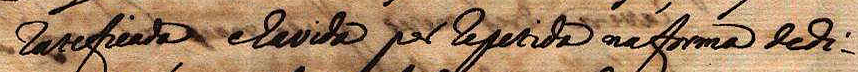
Rateficada, e havida por Repetida na forma de di
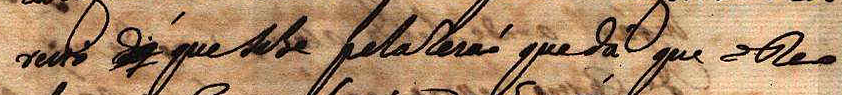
reito dis que sabe pela Rezaõ que dá, que o Reo
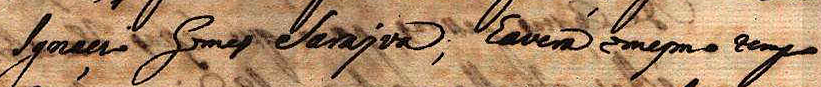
Ignacio Gomes Sarajva; haverá o mesmo tempo
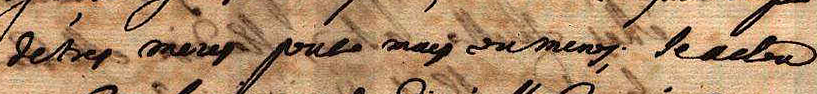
de tres mezes pouco mais ou menos; se achou
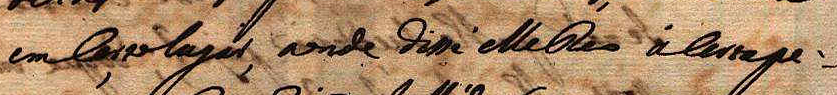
em Certo lugar, aonde disse elle Reo a certa pe
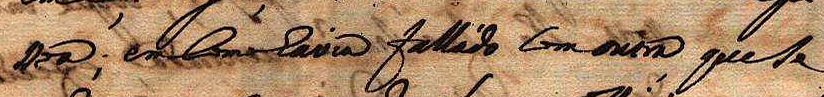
ssoa; em Como havia fallado com outra, que se
